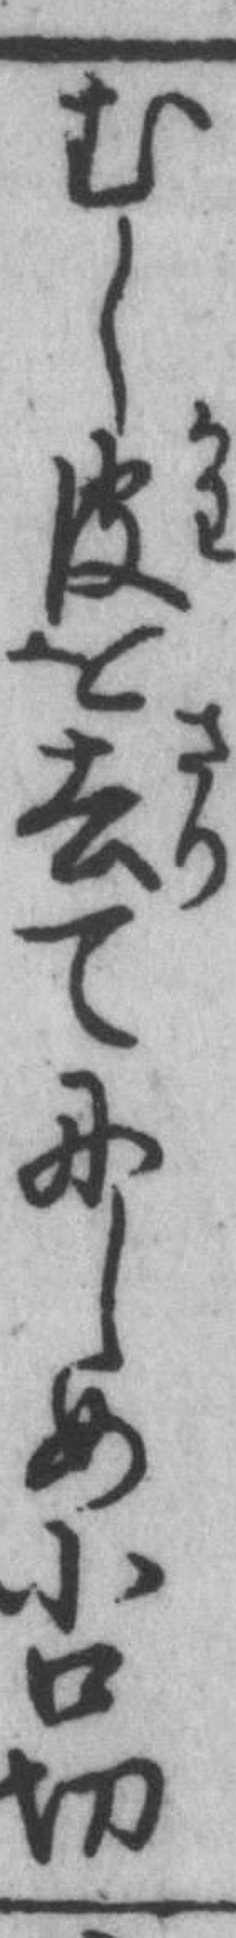むし皮を去てにしめこぐ小口切
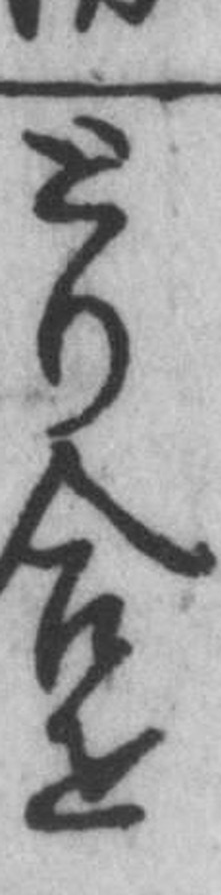とり合を
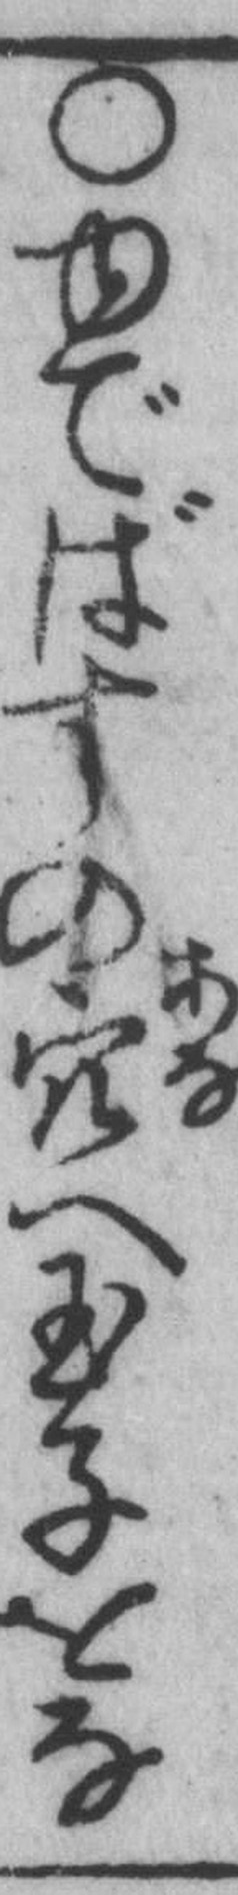〇ゆでばすの穴へ玉子をな
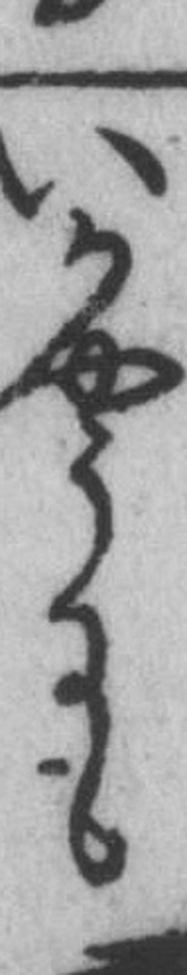いかやうにも
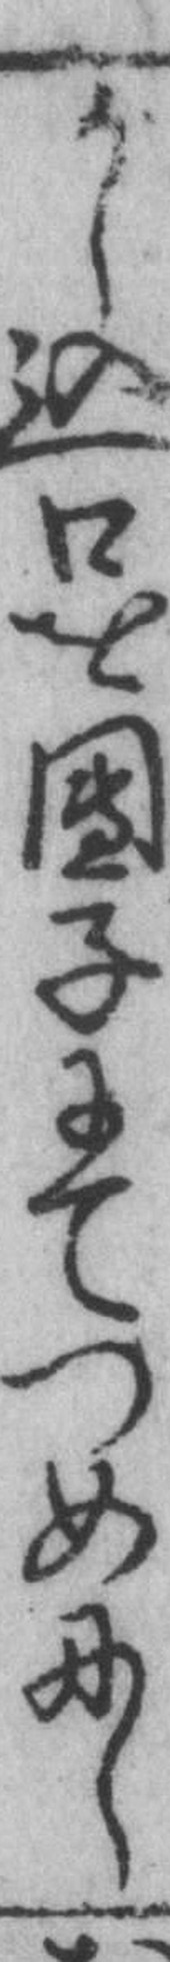がし込口を團子にてつめにし
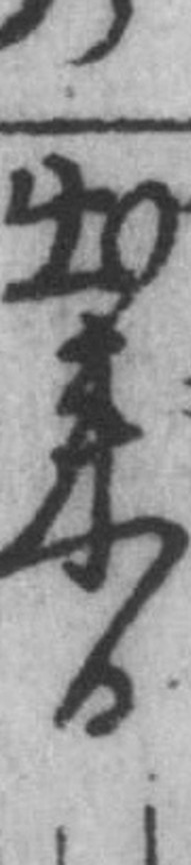出来る
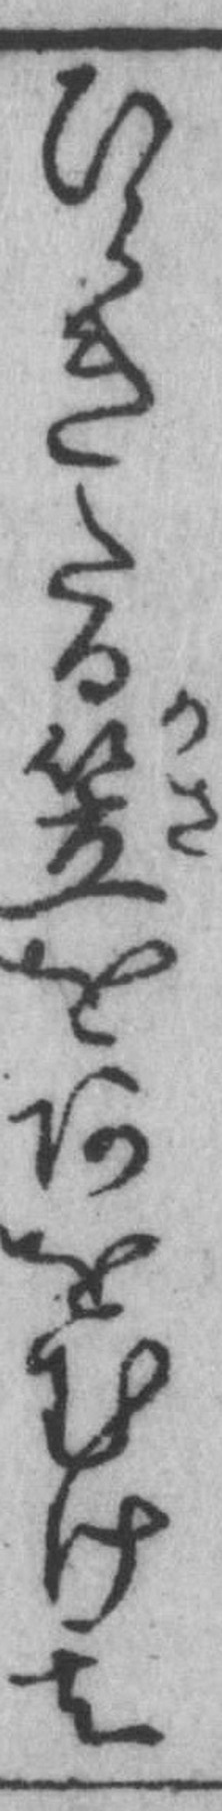ひらきたる笠をあを向け
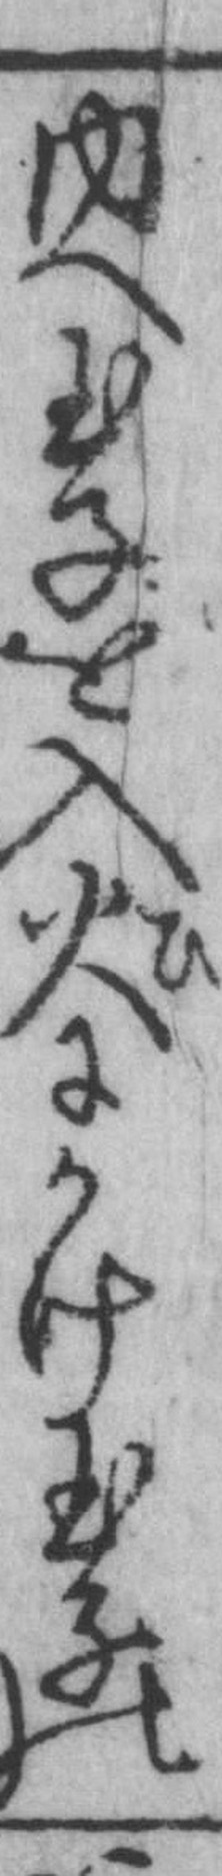内へ玉子を入火にかけ玉子の
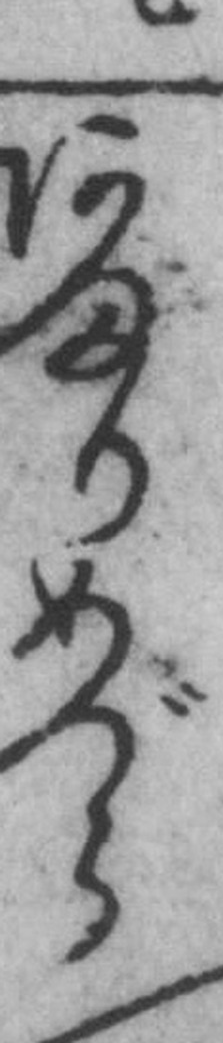何なりめづら
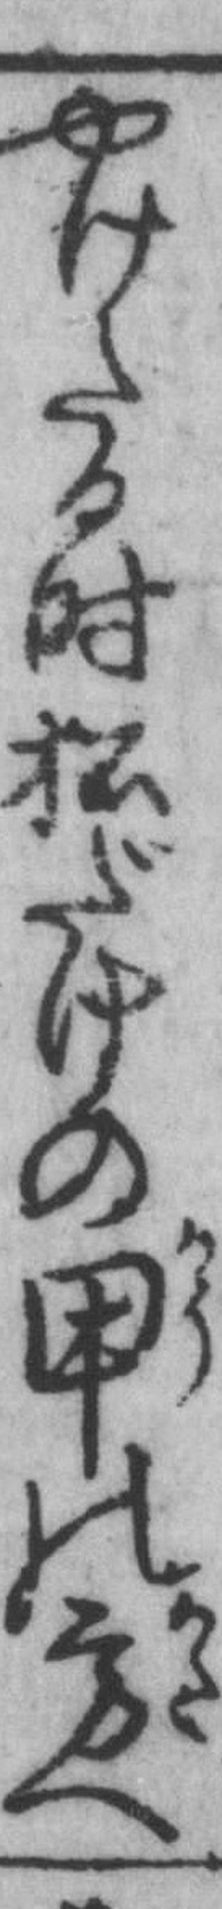やけたる時松だけの甲の方へ
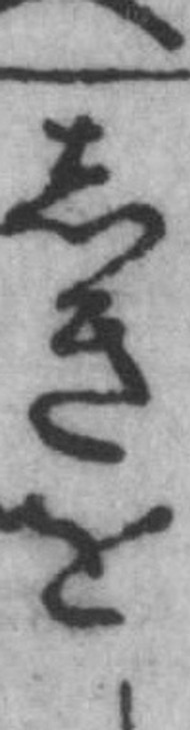しきを
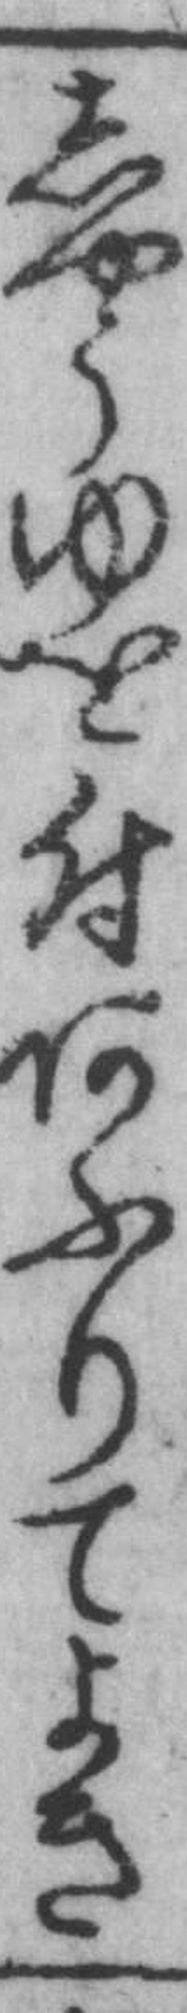しやうゆを付あふりてよき
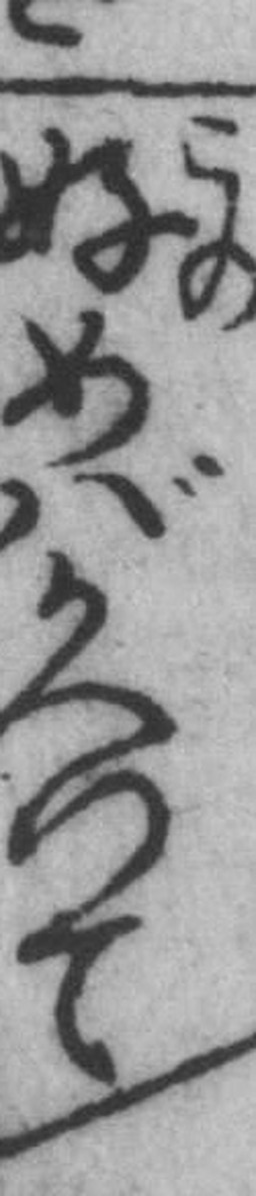好めバかへつて
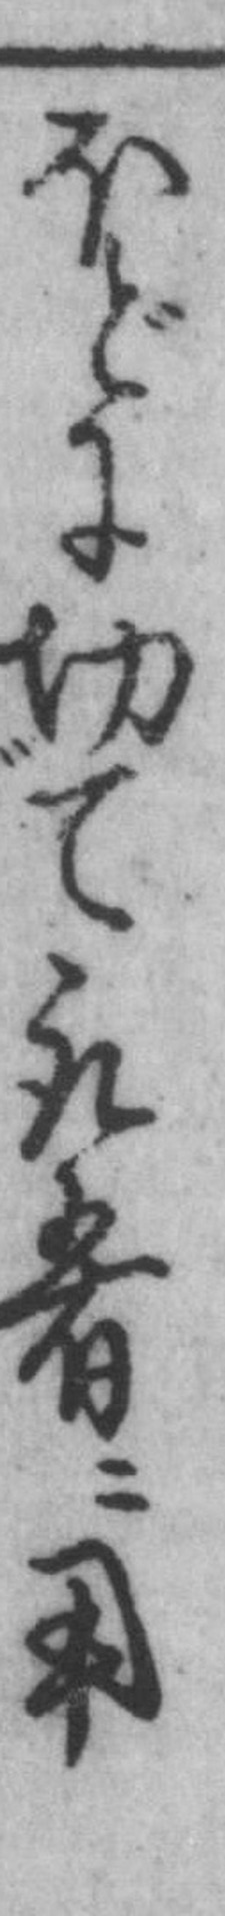ほどに切て取肴ニ用
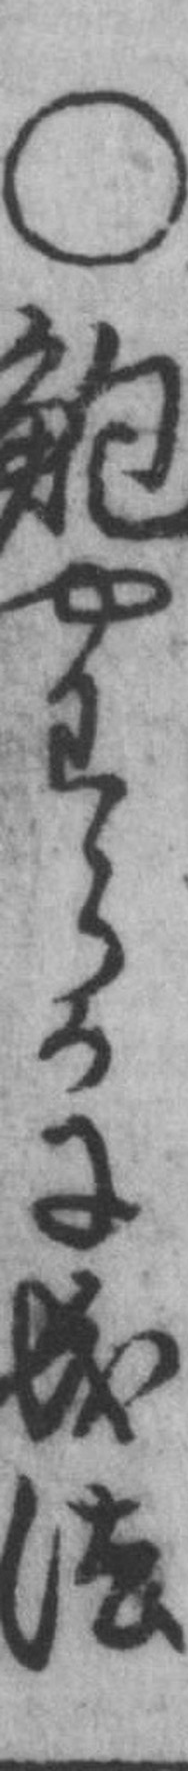〇鮑やわらかに法

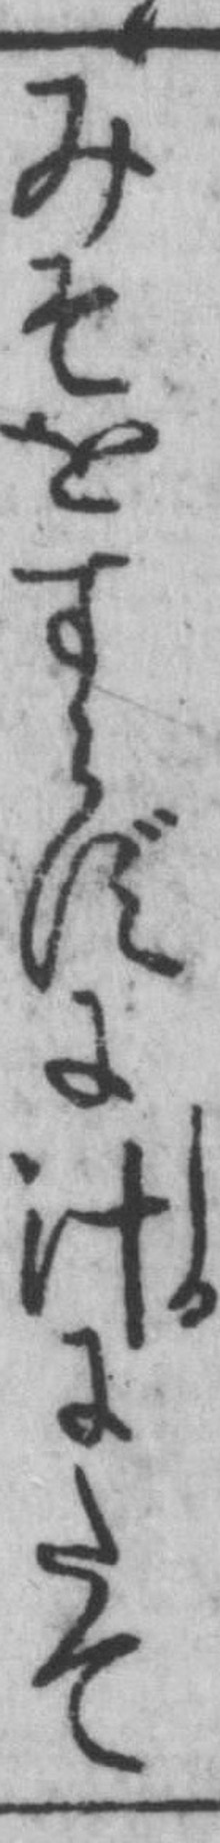みそをすらずに汁にたて
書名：料理献立抄
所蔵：大阪府立大学学術情報センター 国文学研究資料館
